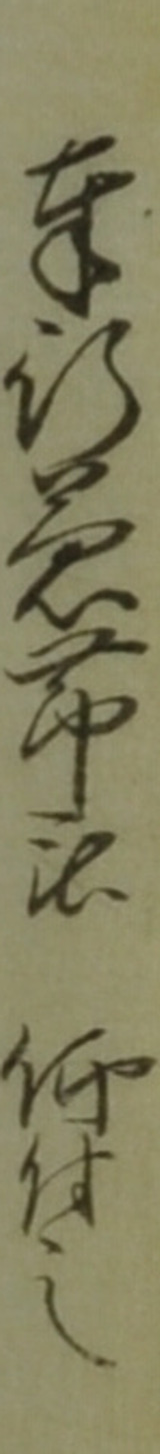奉行兼帯被仰付之
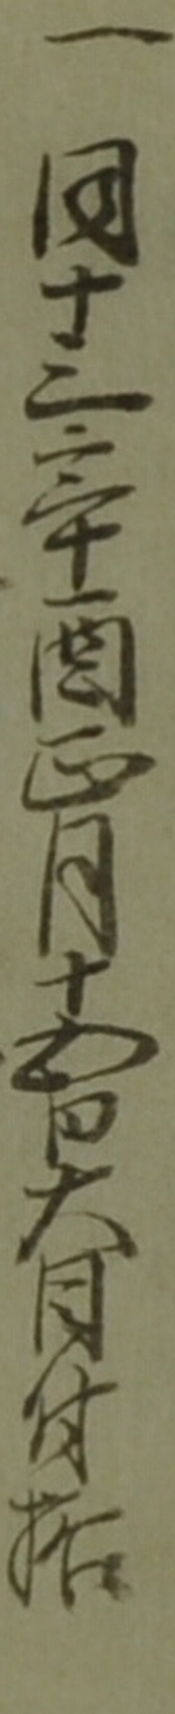一同十三辛酉正月十五日大目付格
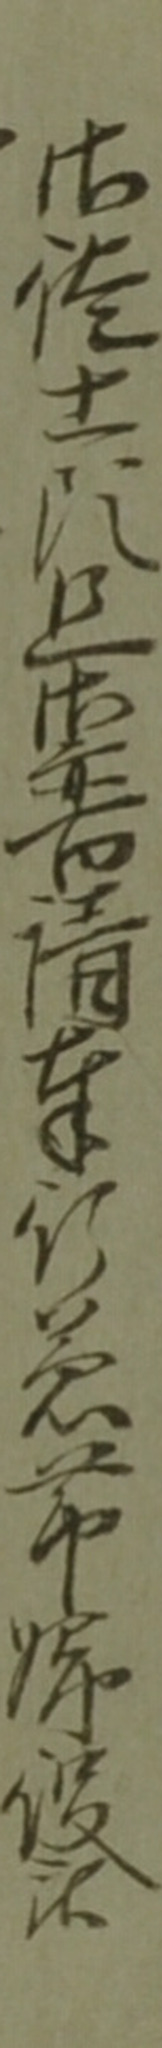御徒士頭且御普請奉行兼帯帰役被
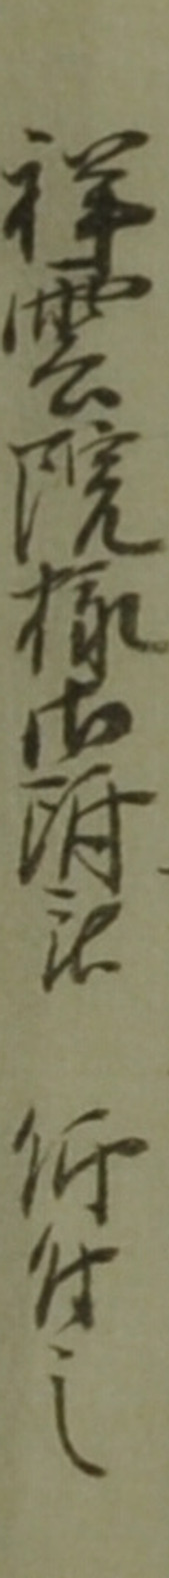祥雲院様御附被仰付之
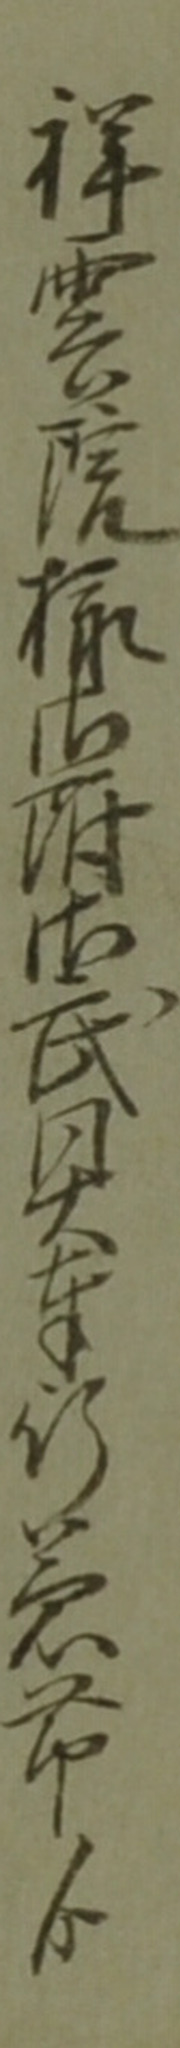祥雲院様御附御武具奉行兼帯ゟ
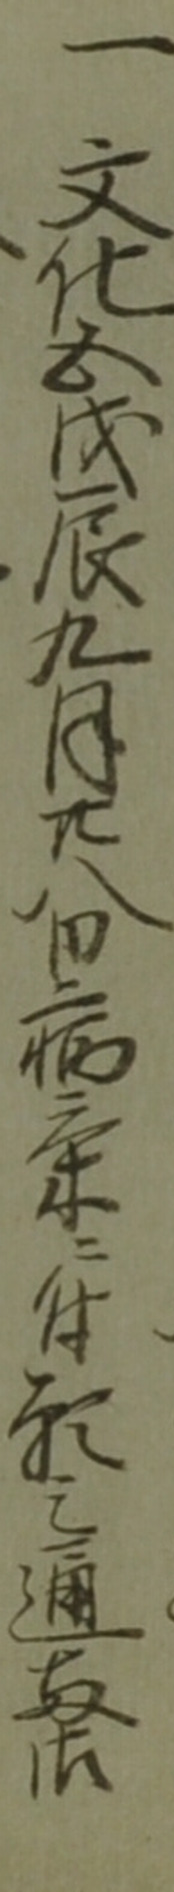一文化五戊辰九月廿八日病気ニ付願之通両御
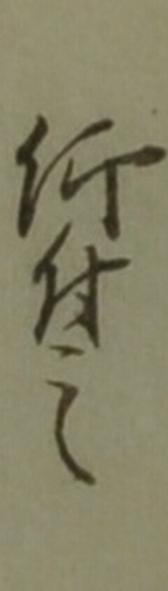仰付之
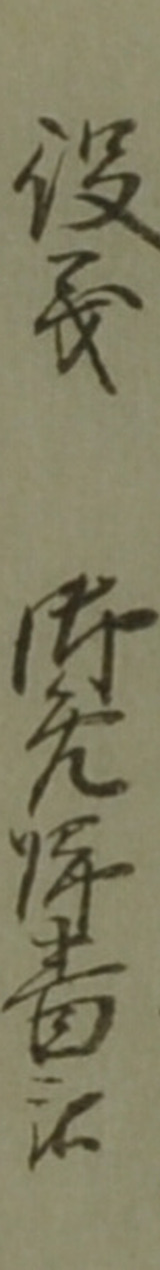役義御免帰番被
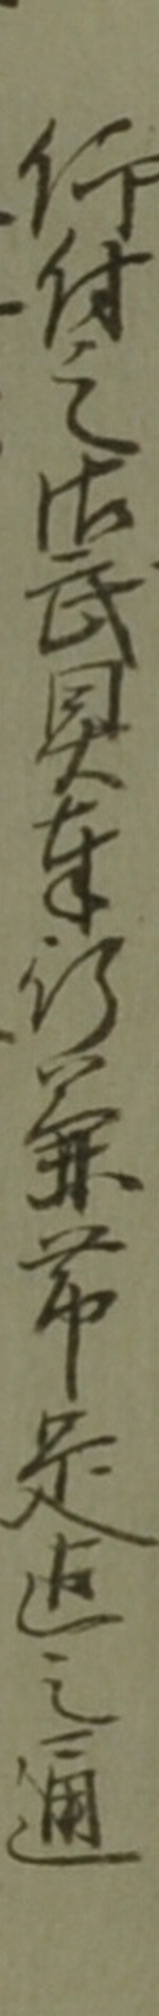仰付之御武具奉行兼帯是迄之通
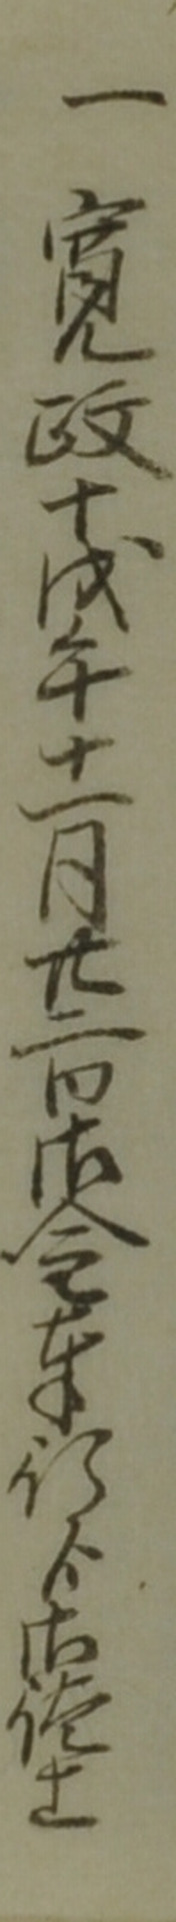一寛政十戊午十一月廿二日御金奉行ゟ御徒士
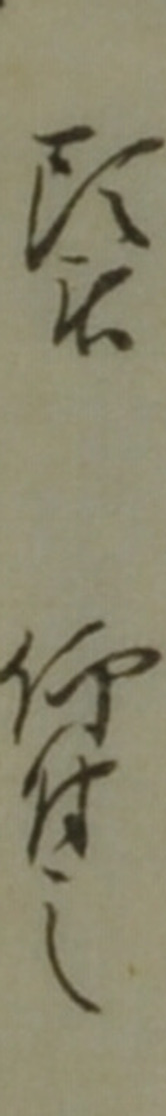頭被仰付之
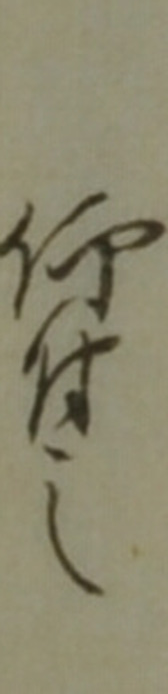仰付之
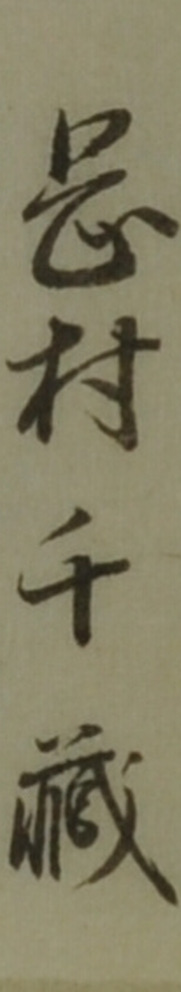岡村千蔵
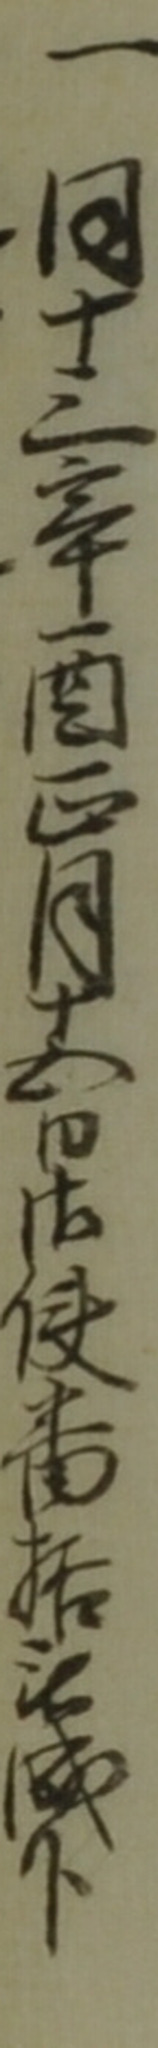一同十三辛酉正月十五日御使番格被成下
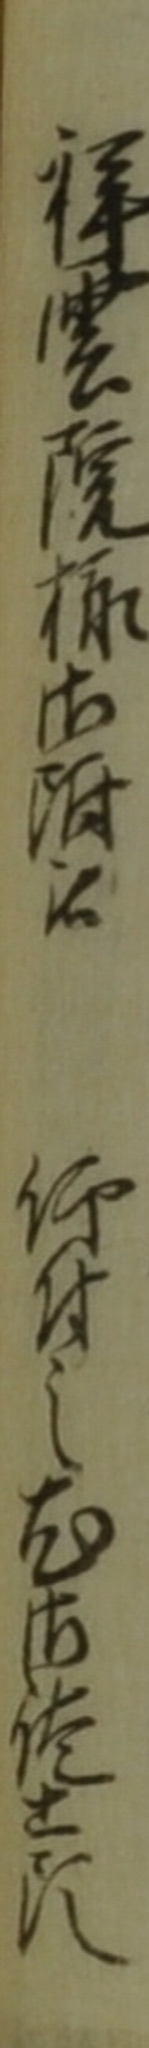祥雲院様御附被仰付之尤御徒士頭
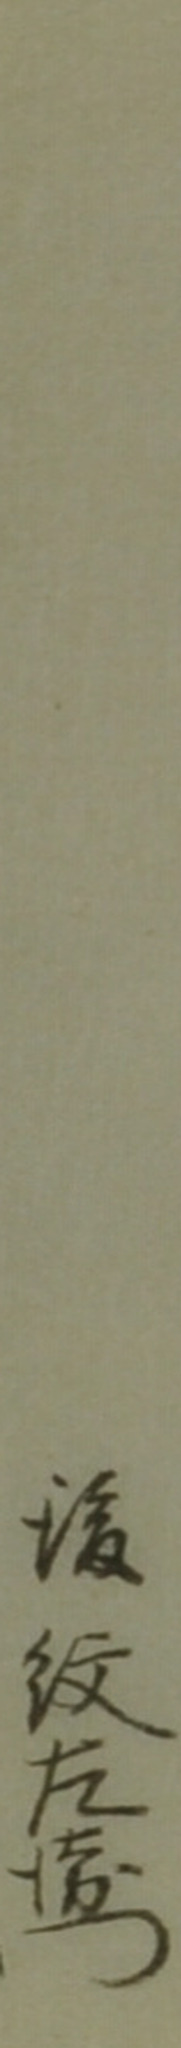後紋左衛門
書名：諸御役代々録（六）
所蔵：伊那市立高遠町図書館・合同会社AMANE
